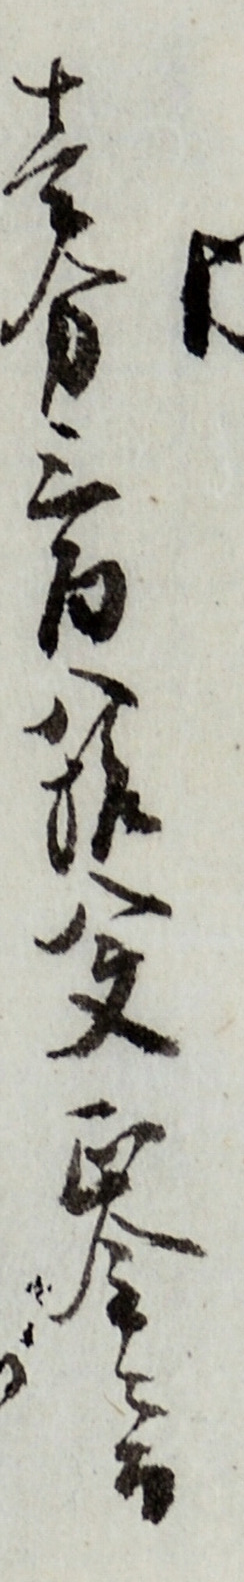壱分三百八拾八文正金ニ而
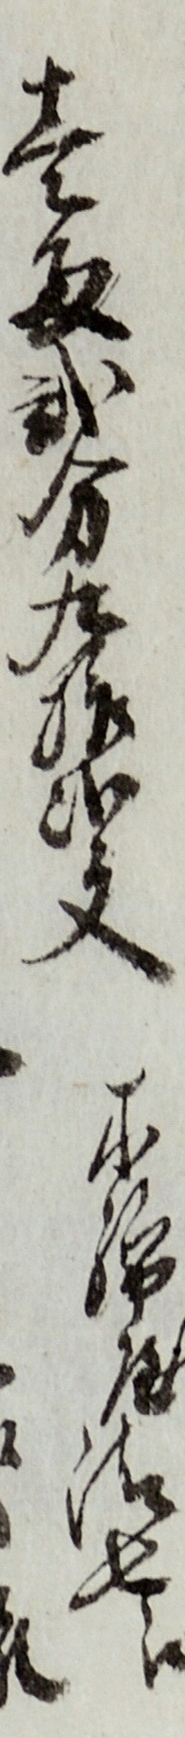壱両弐分九拾弐文木綿清七江
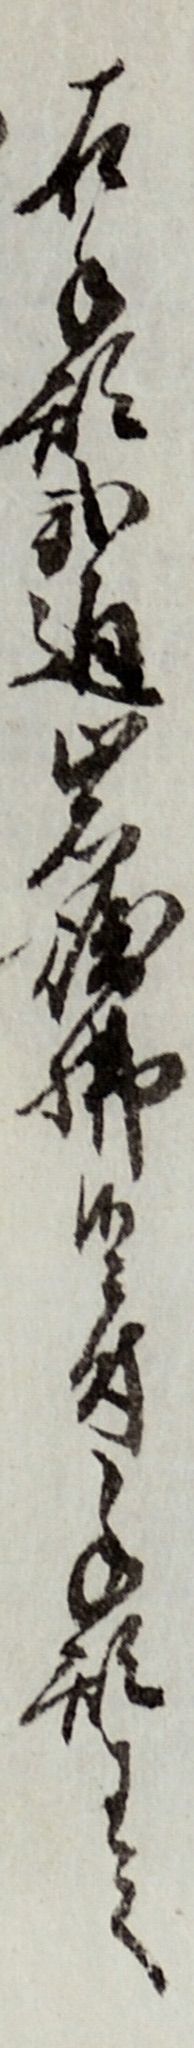右手形弐通岩崎候二付手形有之
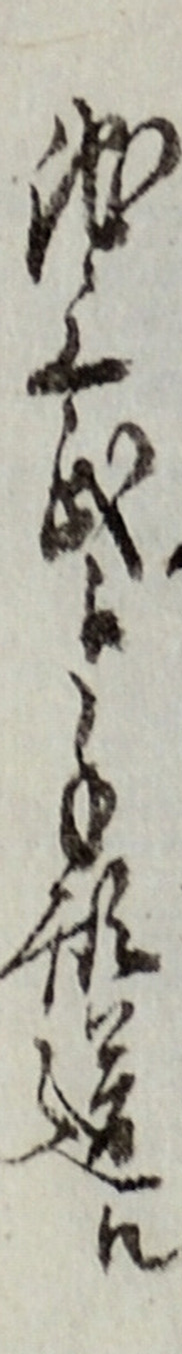池上氏江手形送ル
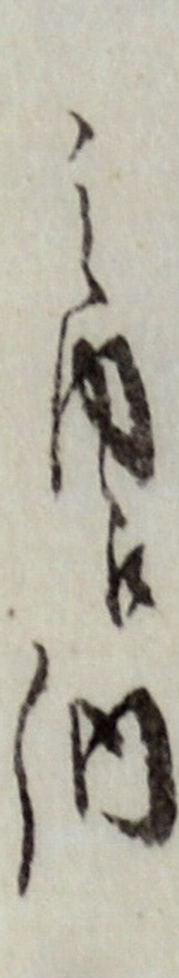之内江納

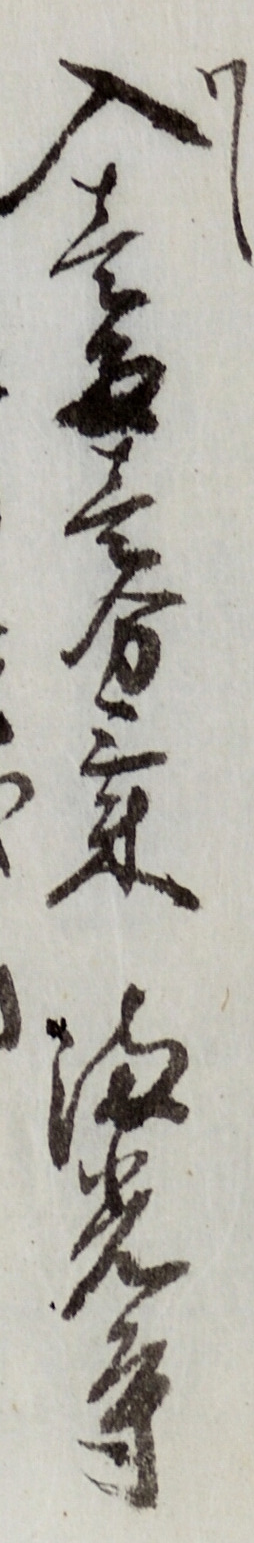入壱両壱分三朱満光寺
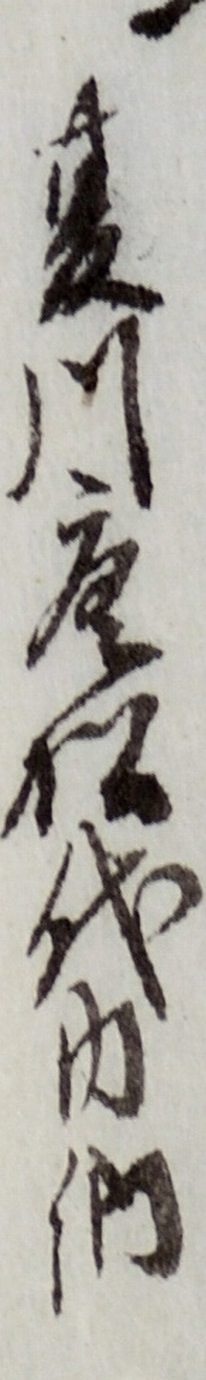夏川唐松代内納
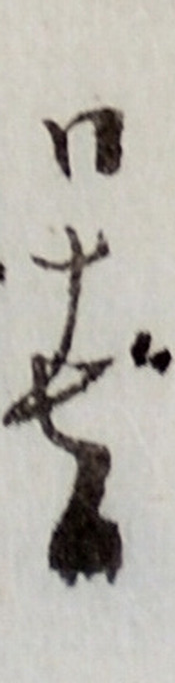同十七日
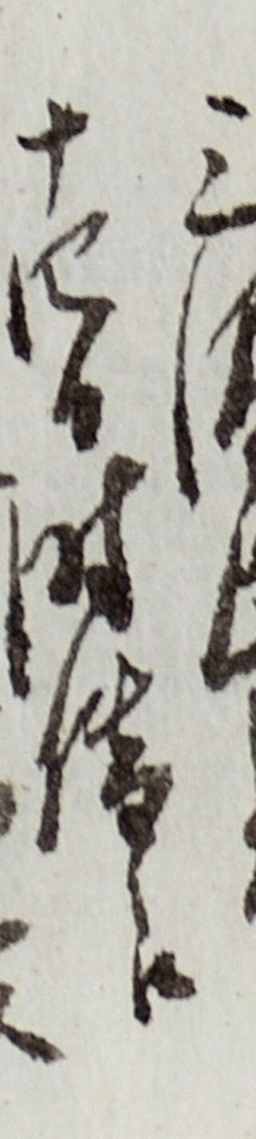十四日時借江
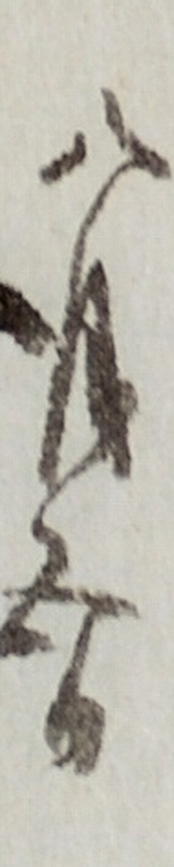八月五日
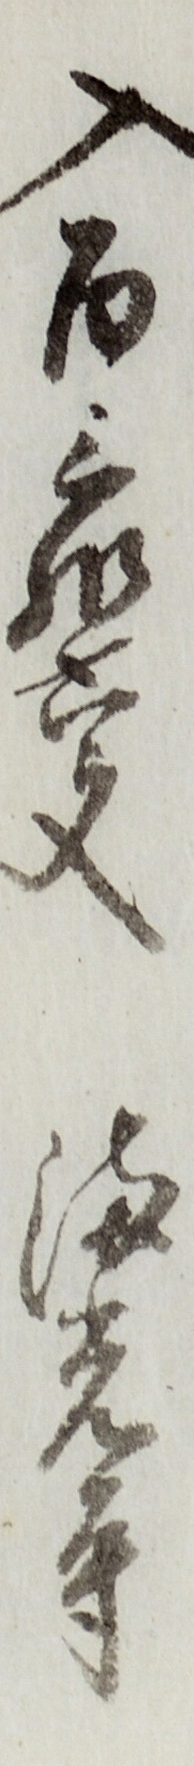入百三拾六文満光寺
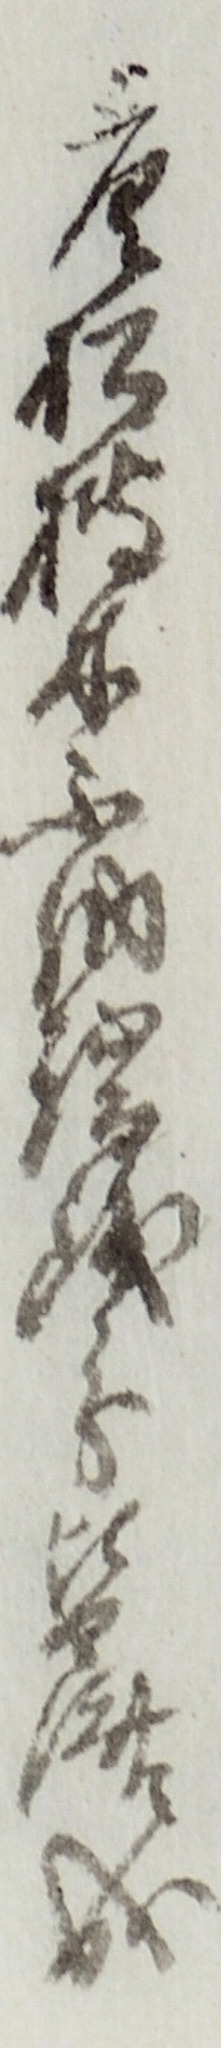唐松榑木不納端銭之分皆済成
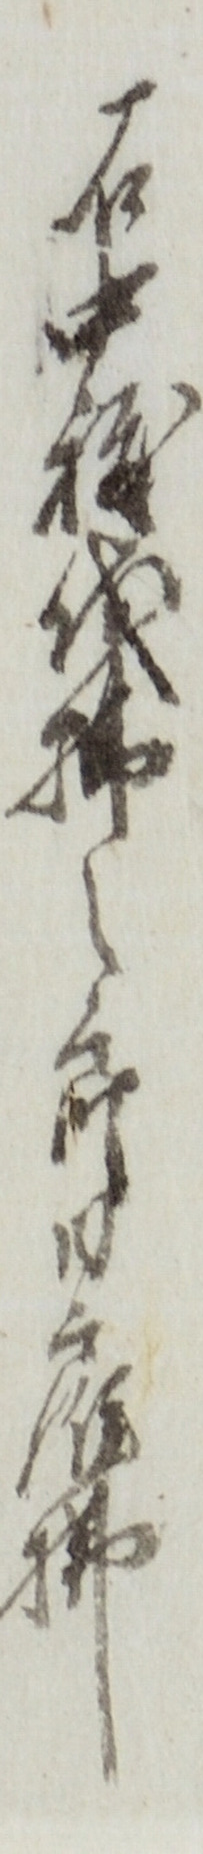右中程伐払之節日雇払
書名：中沢郷御竹薮見廻り
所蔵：伊那市立高遠町図書館・合同会社AMANE
